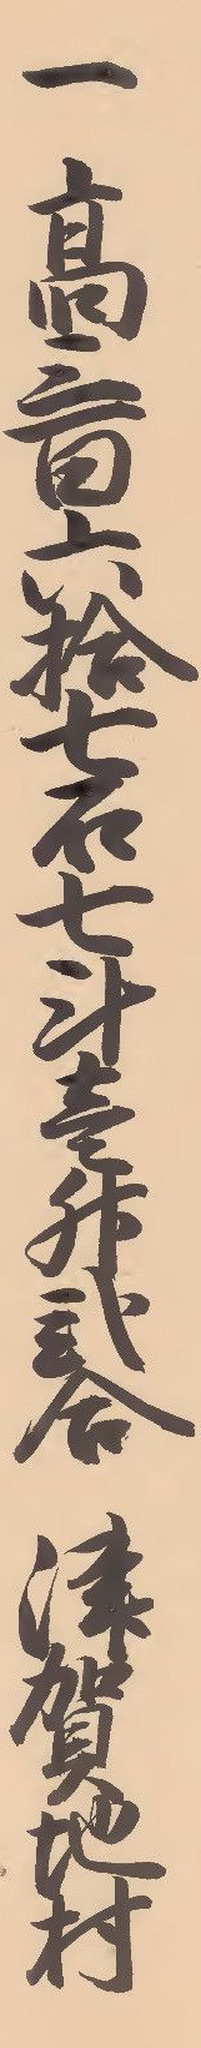一髙三百六拾七石七斗壱升弐合津賀地村
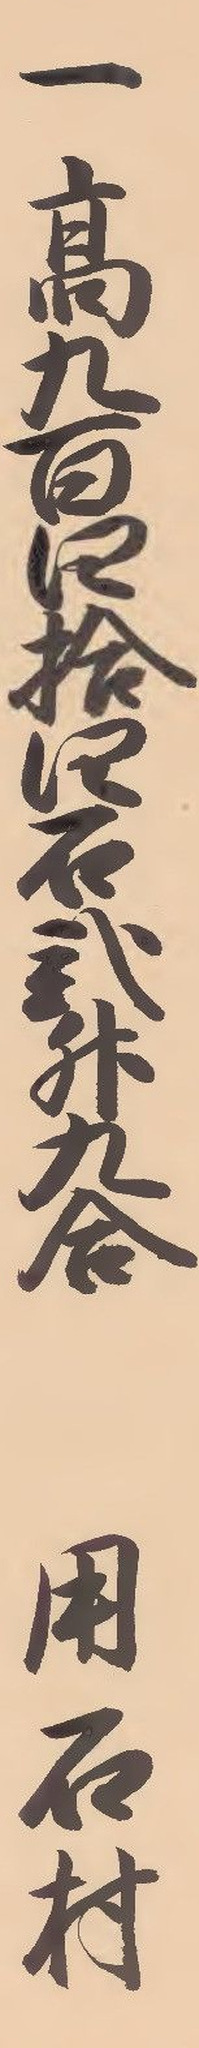一髙九百四拾四石弐升九合用石村
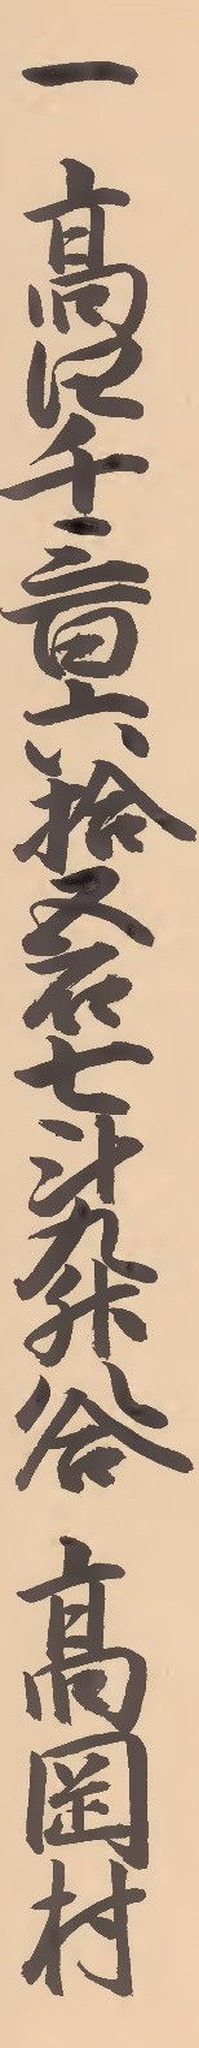一髙四千三百六拾五石七斗九升八合髙岡村
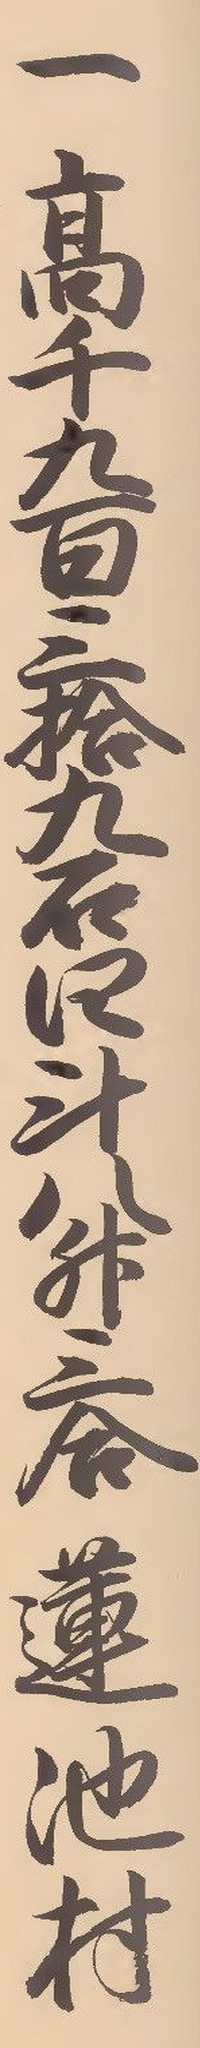一髙千九百三拾九石四斗八升三合蓮池村
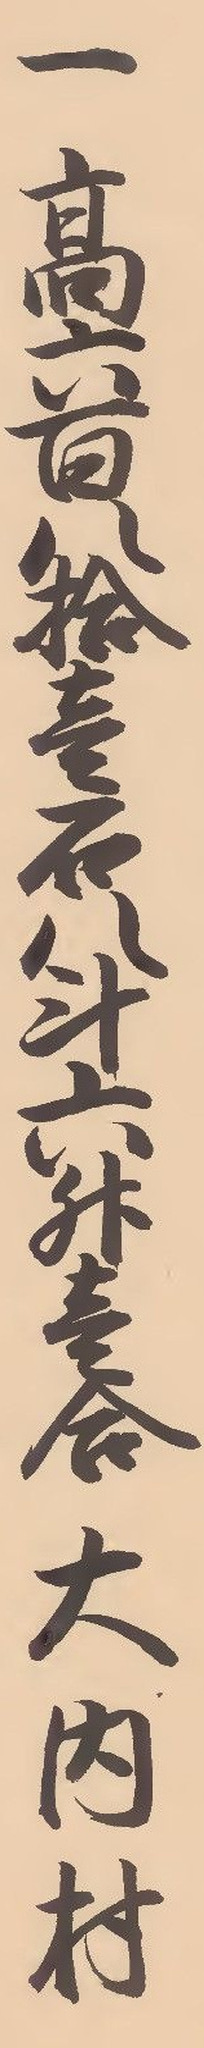一髙六百八拾壱石八斗六升壱合大内村
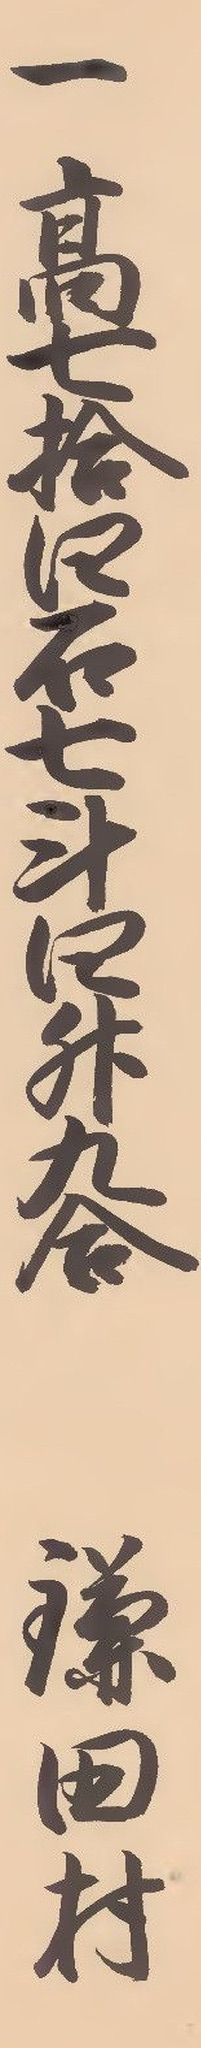一髙七拾四石七斗四升九合鎌田村
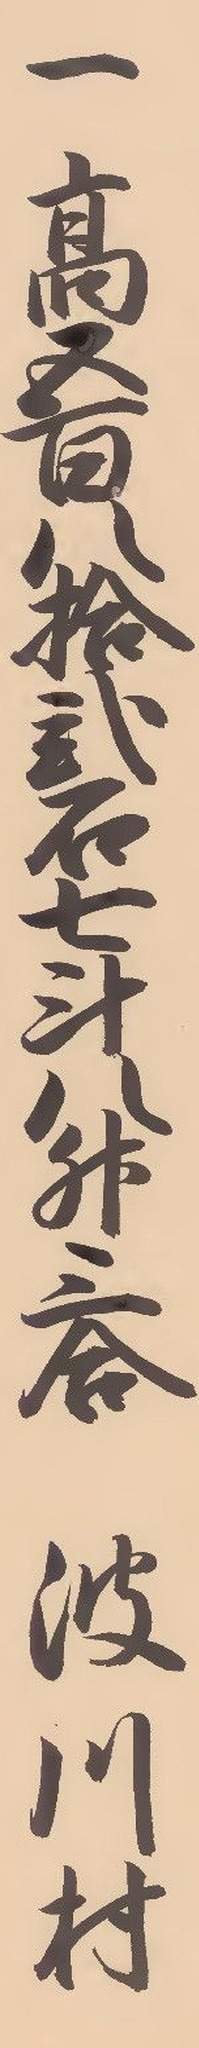一髙五百八拾弐石七斗八升三合波川村

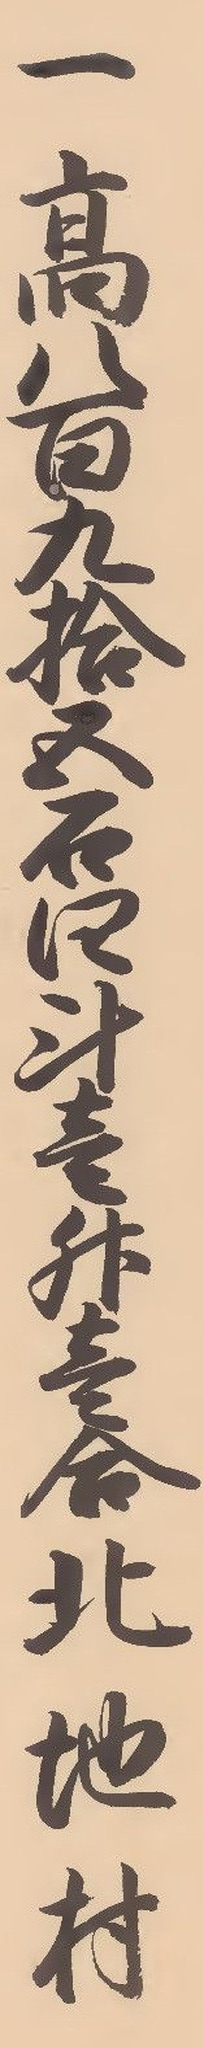一髙八百九拾五石四斗壱升壱合北地村
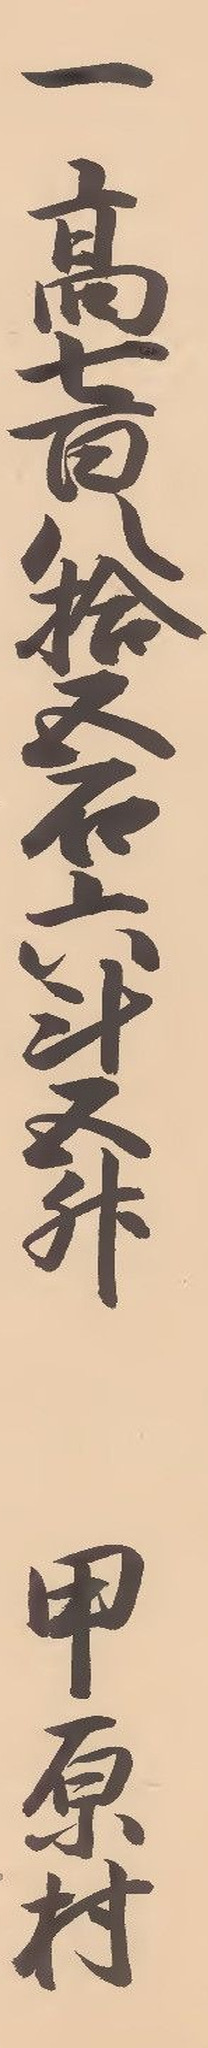一髙七百八拾五石六斗五升甲原村
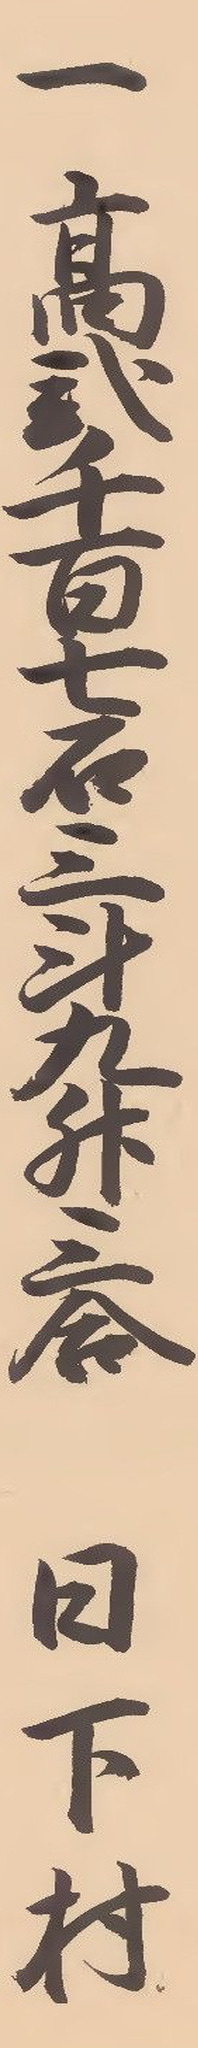一髙弐千百七石三斗九升三合日下村
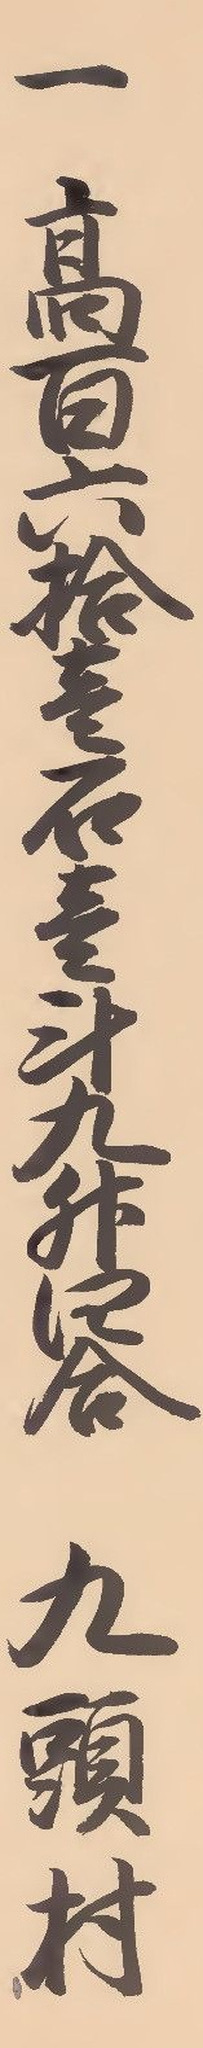一髙百六拾壱石壱斗九升四合九頭村
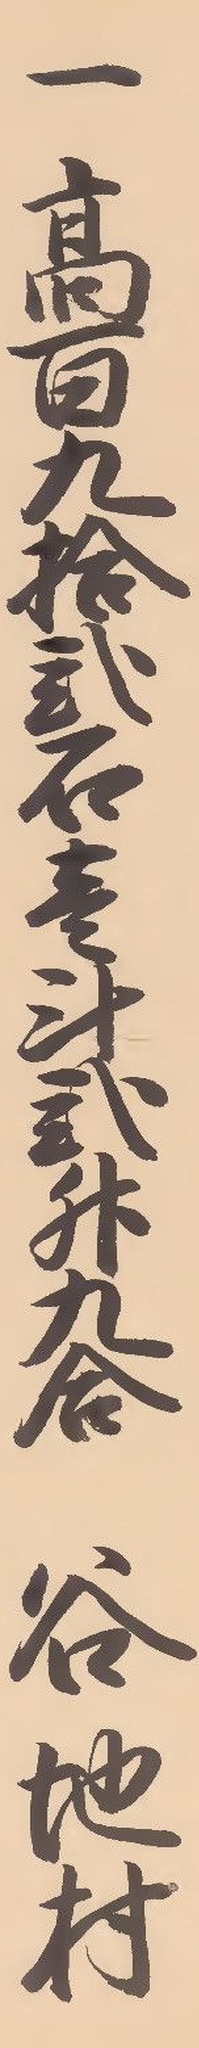一髙百九拾弐石壱斗弐升九合谷地村
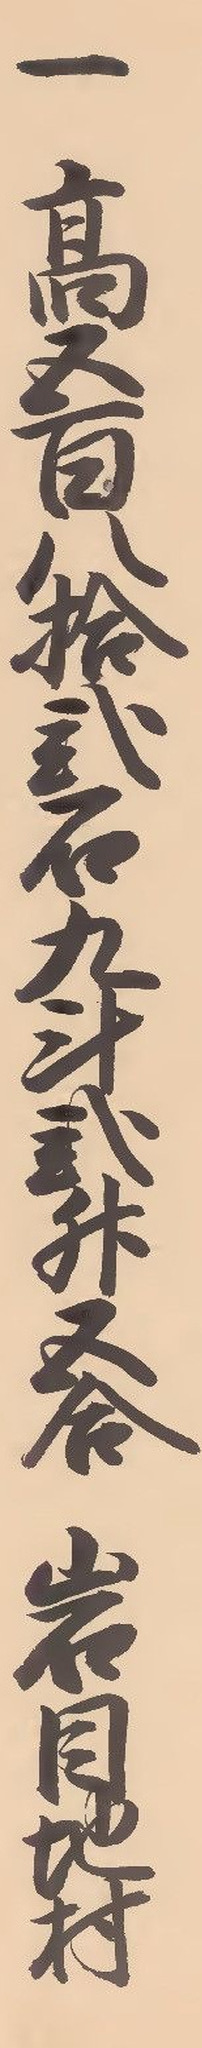一髙五百八拾弐石九斗弐升五合岩目地村

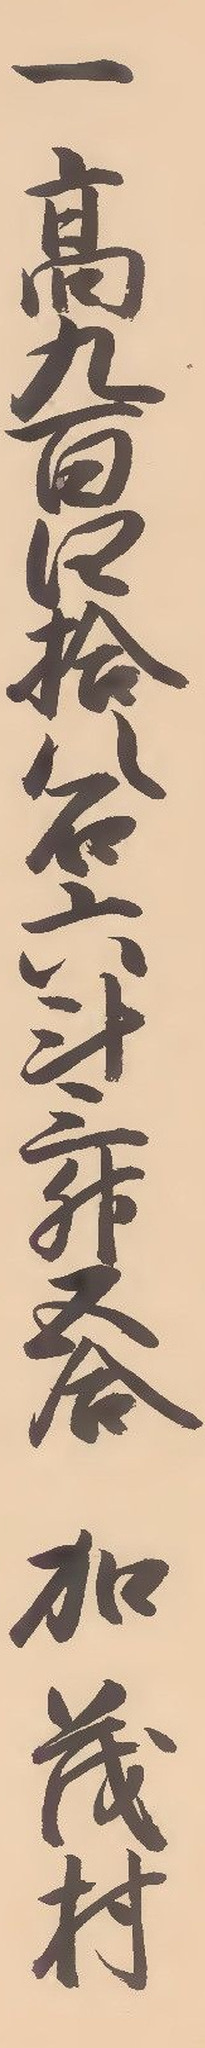一髙九百四拾八石六斗三升五合賀茂村
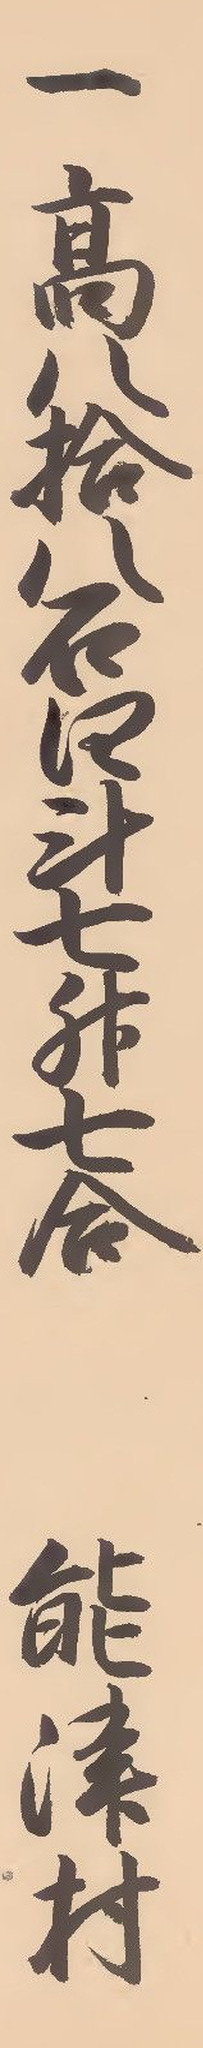一髙八拾八石四斗七升七合能津村
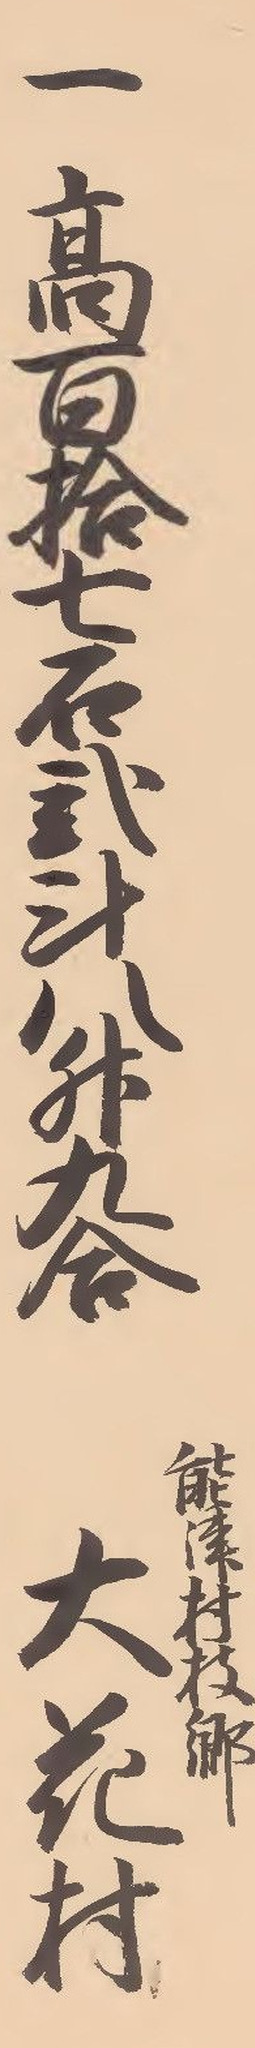一髙百拾七石弐斗八升九合大花村
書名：土佐国郷帳
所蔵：国立公文書館 National Archives of Japan
